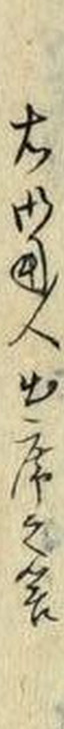右御用人出席之筈

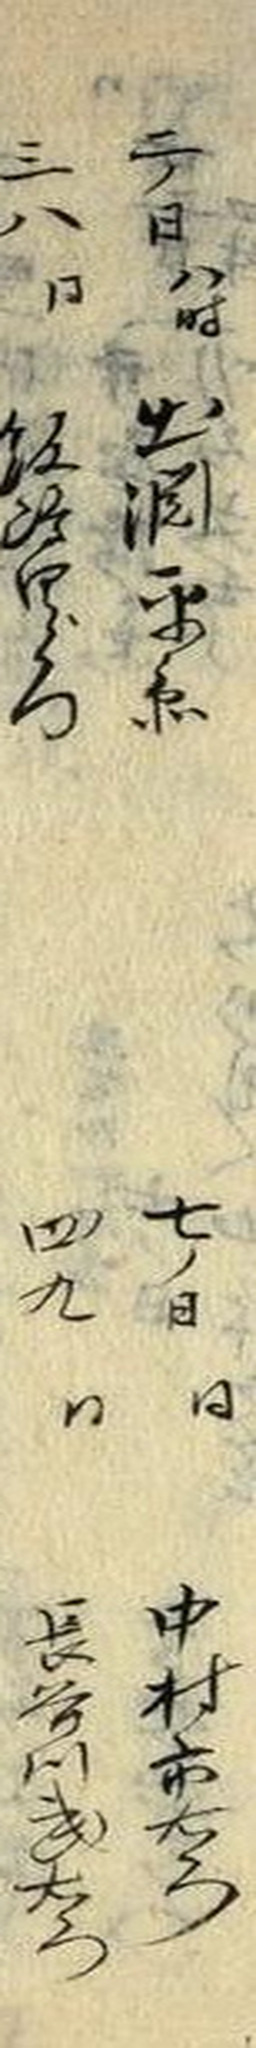三八同飯嶋四郎右衛門四九同長谷川武右衛門
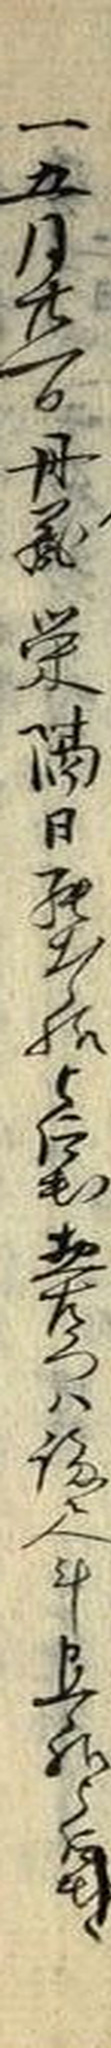一五月廿一日丹蔵栄隔日罷出候様被仰出惣左衛門ハ講尺斗申上候様被仰出候
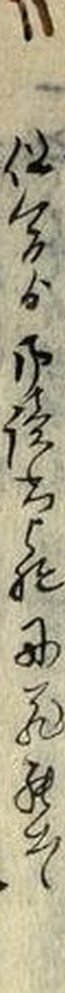但今日ゟ御読書被遊丹蔵罷出候
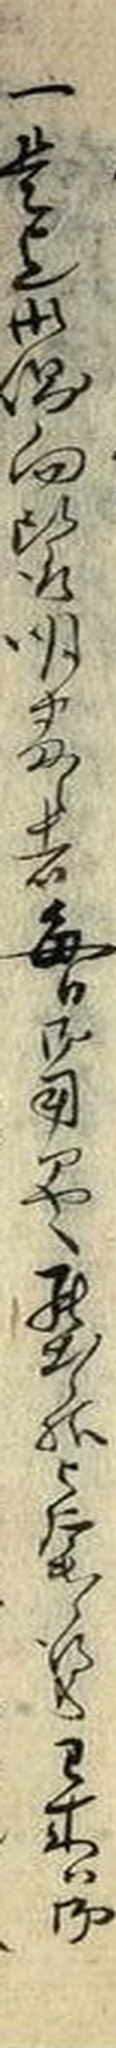一是迄御側向頭取明番之者毎日御用部やへ罷出候様被仰出候得共已来ハ御
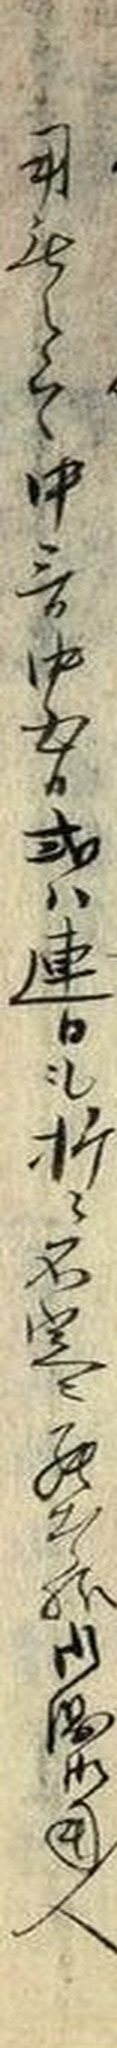用無之候ハヽ中三日中五日或ハ連日も折々不定ニ罷出候様御側御用人
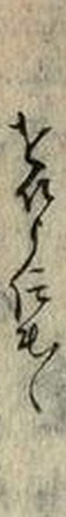を以被仰出候
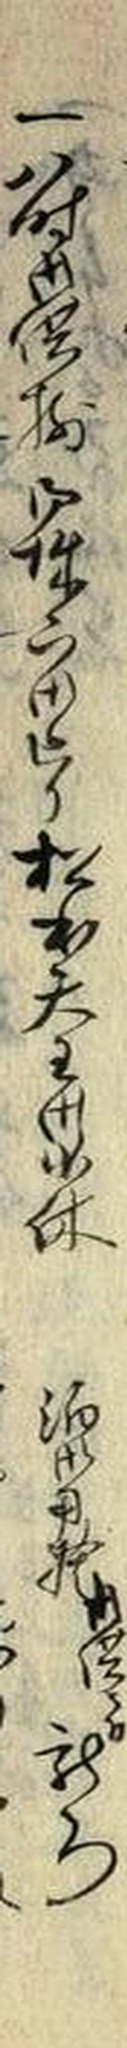一八時御供揃御城下御廻り松本天王御小休泊御用捨御供ニ付新右衛門
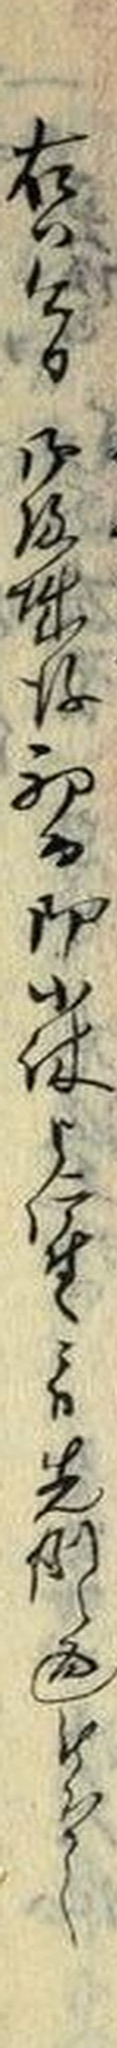右ハ今日御帰城後初而御小休被仰付候ニ付先例之通被下之
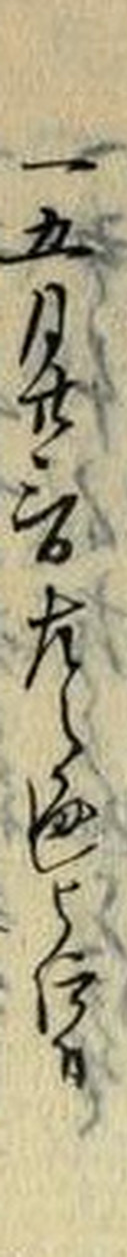一五月廿三日左之通被仰付
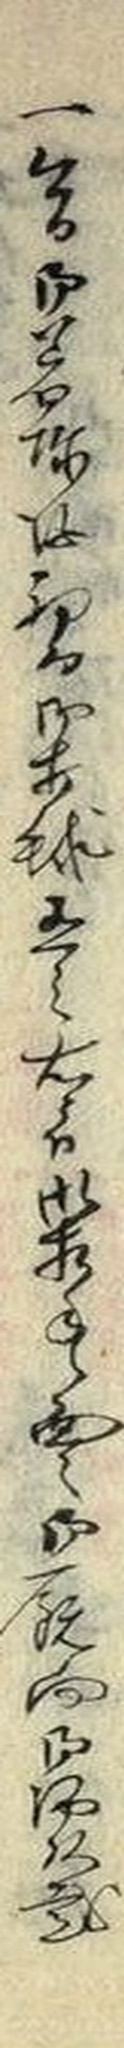一今日御着城後初而御打毬有之右ニ御相手之面々御厩向御酒頂戴
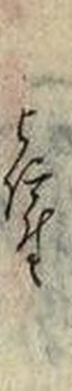被仰付候
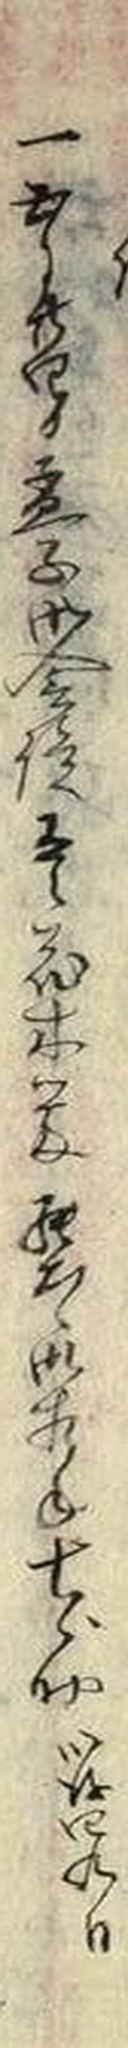一五月廿四日孟子御会読有之花木栄罷出候御相手七之助以後四九日
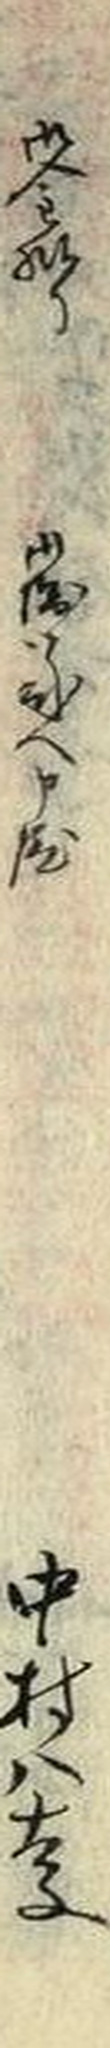御金掛り御側御用人申渡中村八太夫
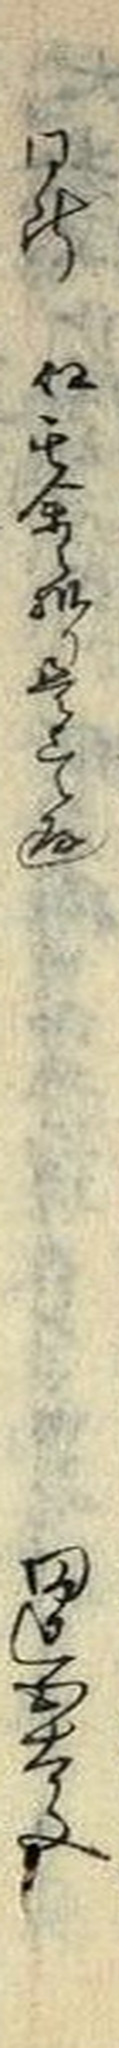同断但其余之掛り是迄之通田辺五太夫
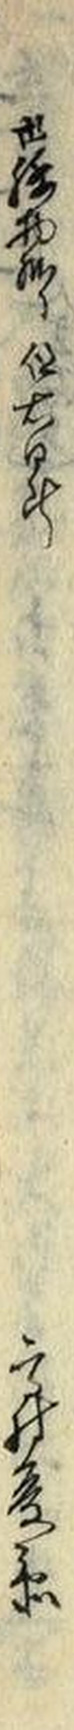御腰物掛り但右同断高村藤兵衛
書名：少傅日録抄（斉承付側向頭取日記、在国）
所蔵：福井県文書館 Fukui Prefectural Archives
